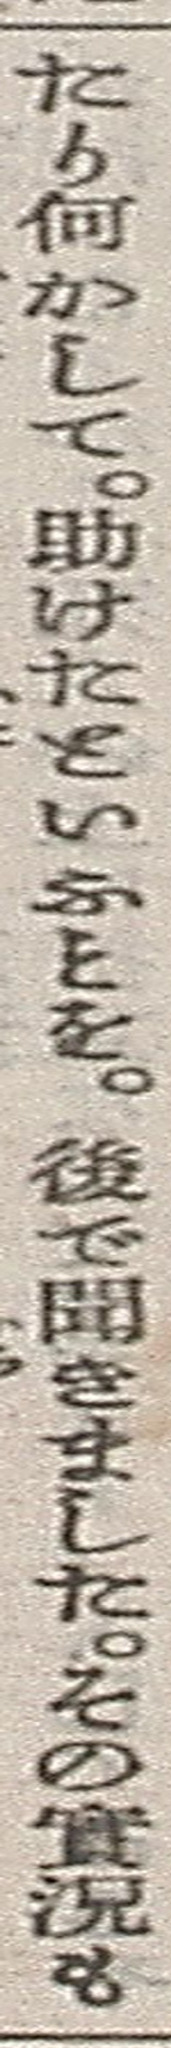たり何かして。助けたといふことを。後で聞きました。その実況も
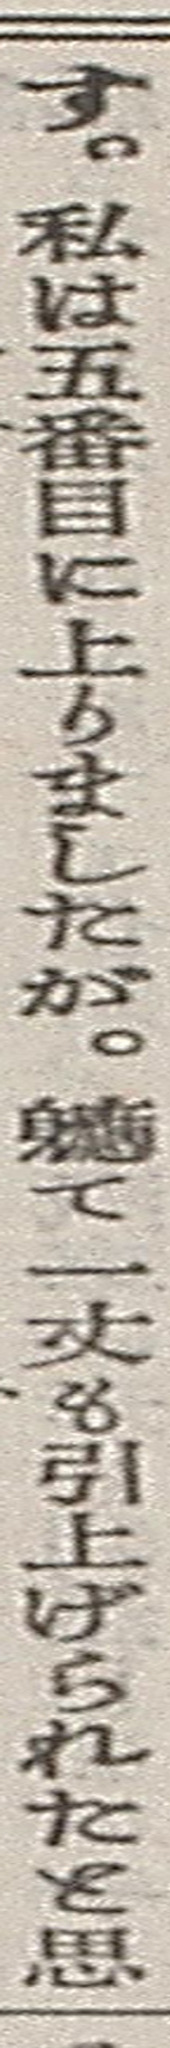す。私は五番目に上りましたが。軈て一丈も引上げられたと思
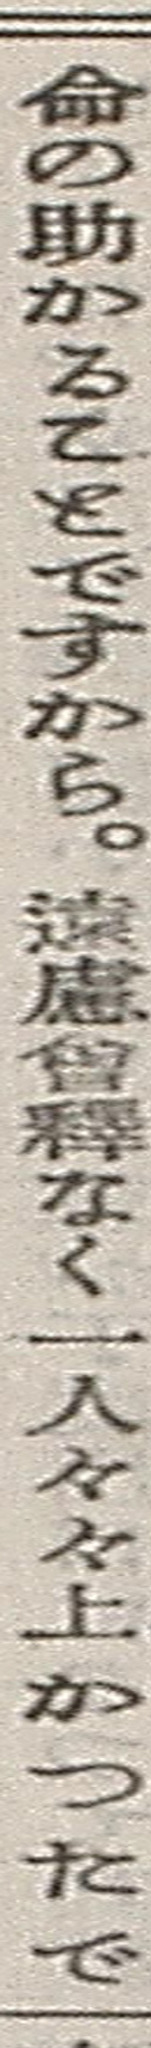命の助かることですから。遠慮会釈なく一人々々上かつたで
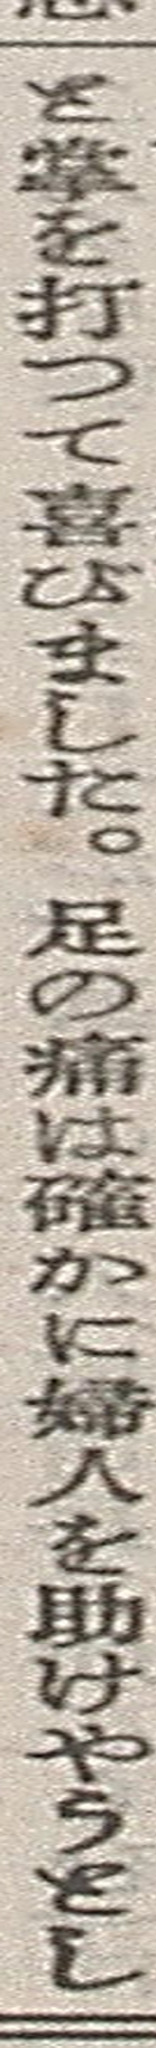と掌を打つて喜びました。足の痛は確かに婦人を助けやうとし
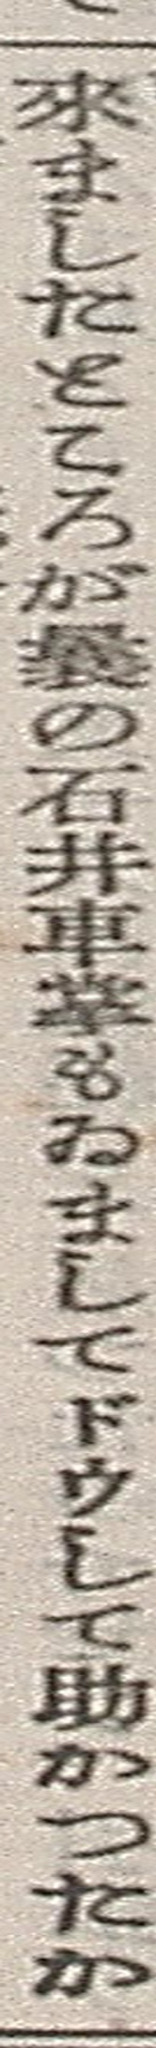来ましたところが曩の石井車掌もゐましてドウして助かつたか
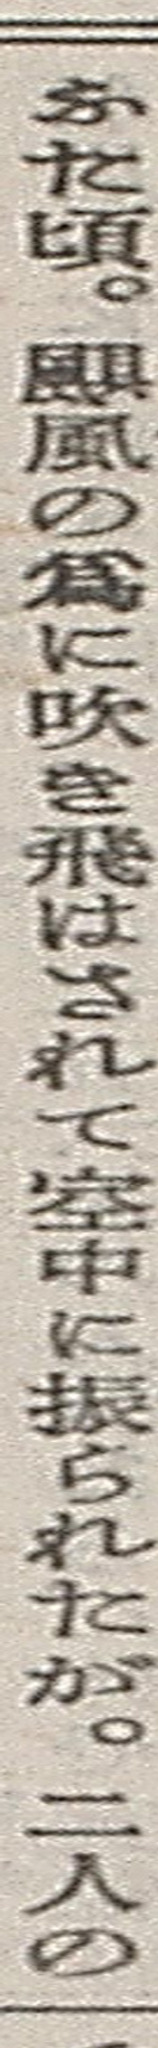ふた頃。颶風の為に吹き飛はされて空中に振られたが。二人の
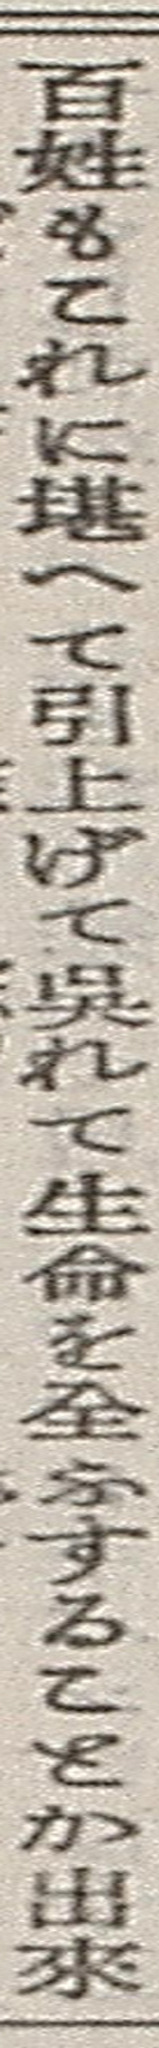百姓もこれに堪へて引上げて呉れて生命を全ふすることか出来
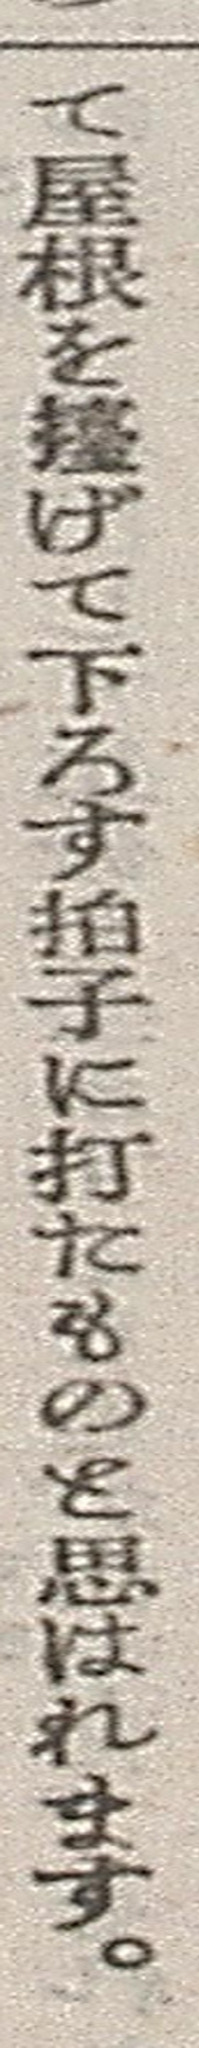て屋根を擡げて下ろす拍子に打たものと思はれます。
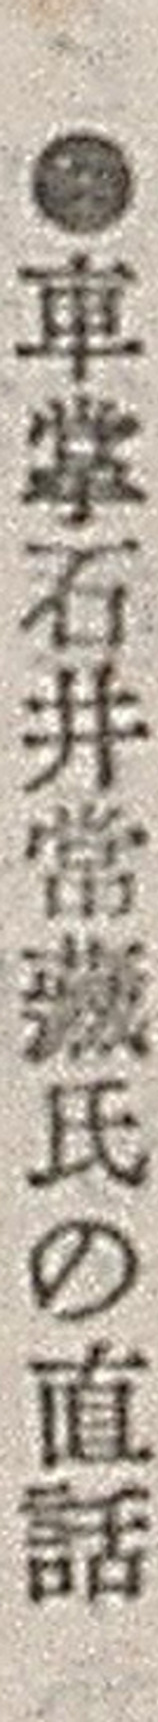●車掌石井常蔵氏の直話
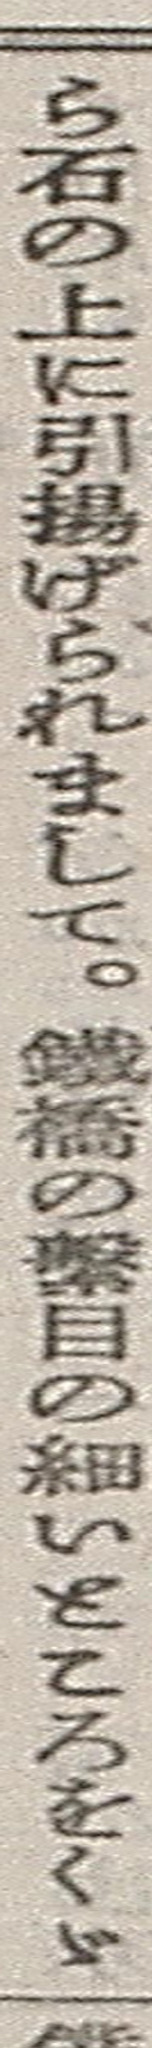ら石の上に引揚げられまして。鉄橋の繋目の細いところをくゞ
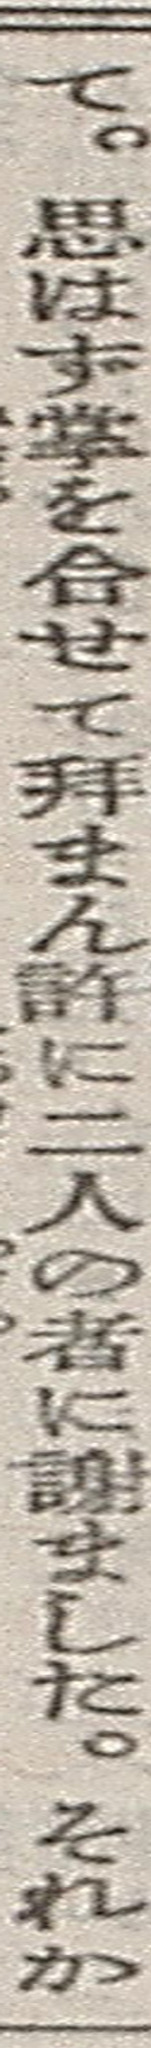て。思はず掌を合せて拝まん許に二人の者に謝ました。それか
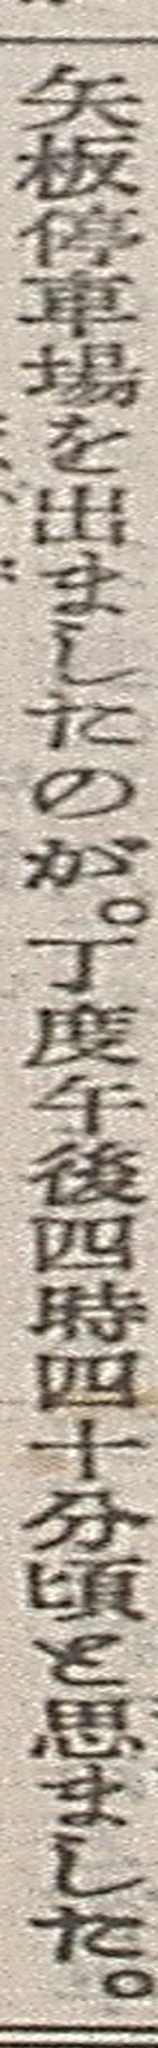矢板停車場を出ましたのが。丁度午後四時四十分頃と思ました。
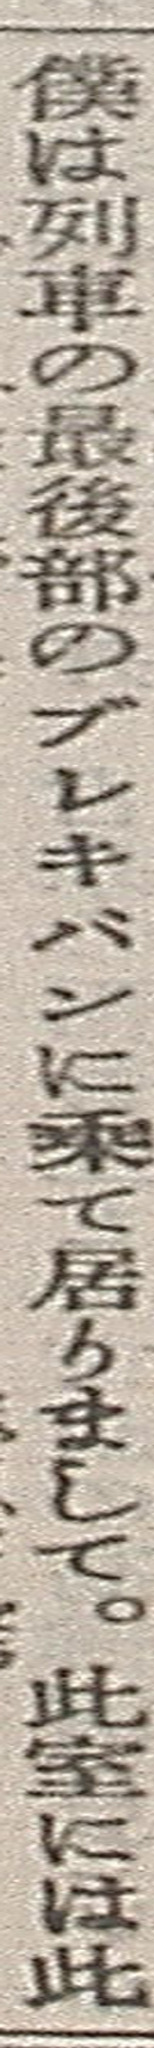僕は列車の最後部のブレキバンに乗て居りまして。此室には此
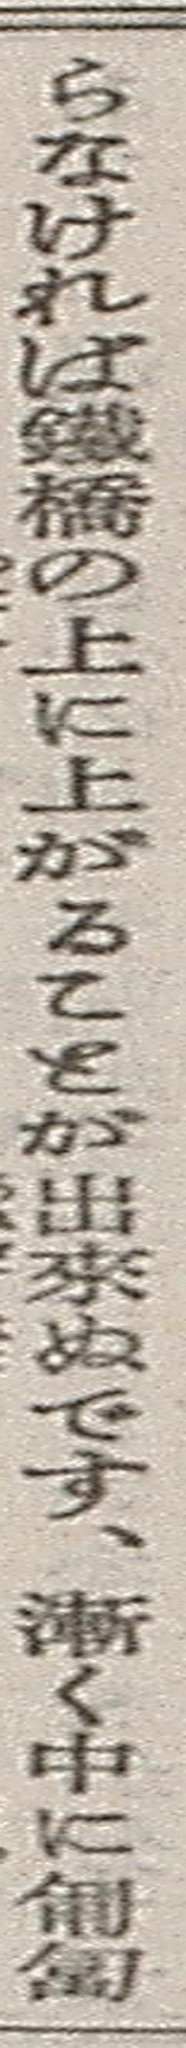らなければ鉄橋の上に上がることが出来ぬです、漸く中に匍匐
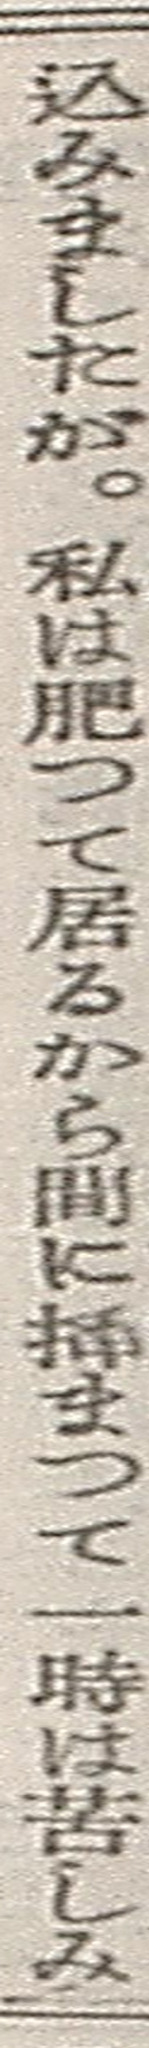込みましたが。私は肥つて居るから間に挿まつて一時は苦しみ
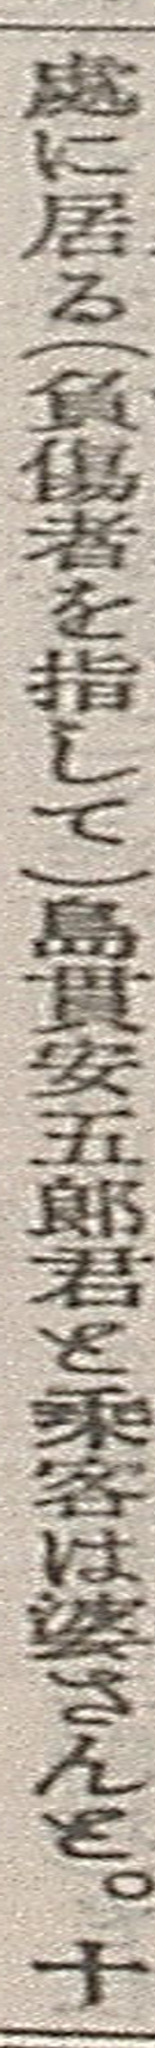処に居るを指して）島貫安五郎君と乗客は婆さんと。十
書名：風俗畫報臨時増刊第百九十九號　明治三十二年十月各地災害圖會（前編之續）
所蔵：東京大学地震研究所図書室 Earthquake Research Institute Library, The University of Tokyo, JAPAN
